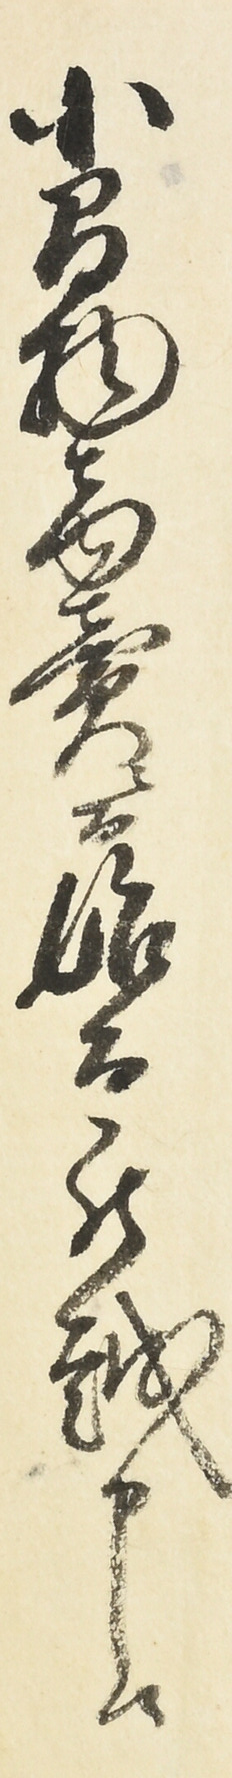小間物商売ニ而始而罷越申候
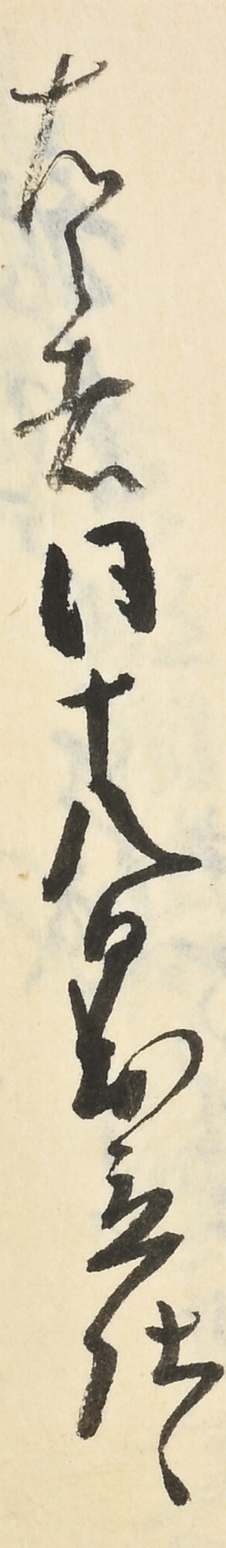右之者同十日出立仕候

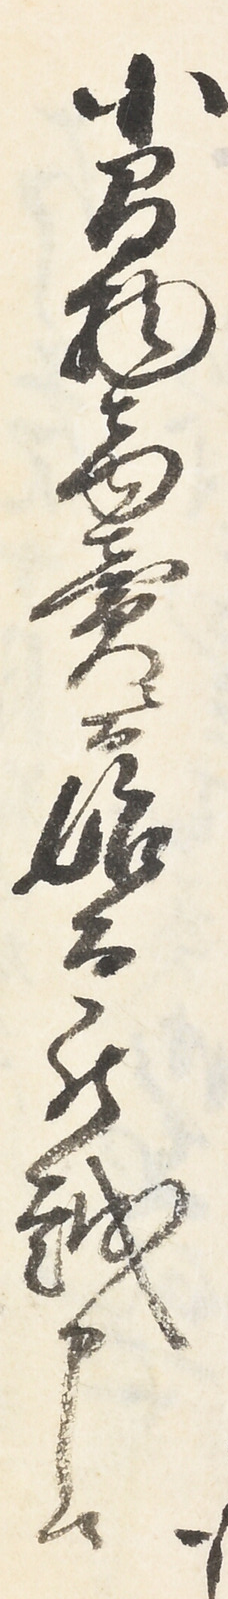たはこ商売ニ而始而罷越申候
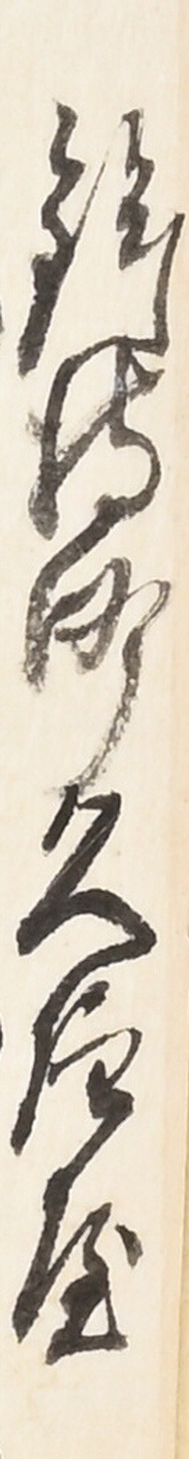鉾持町久住屋
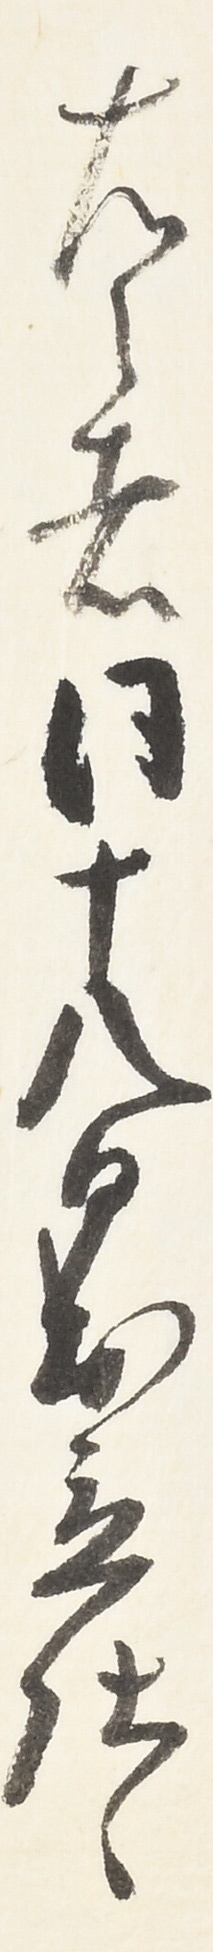右之者同十八日出立仕候
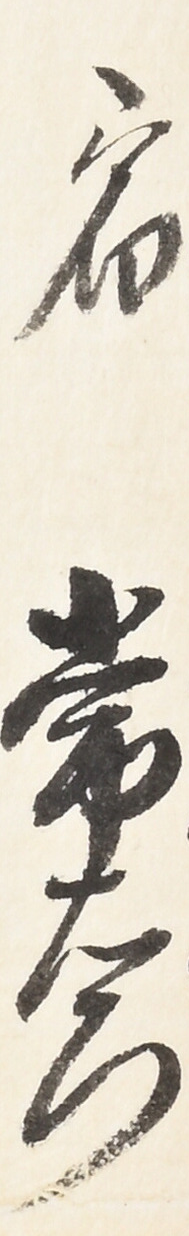宿常右衛門
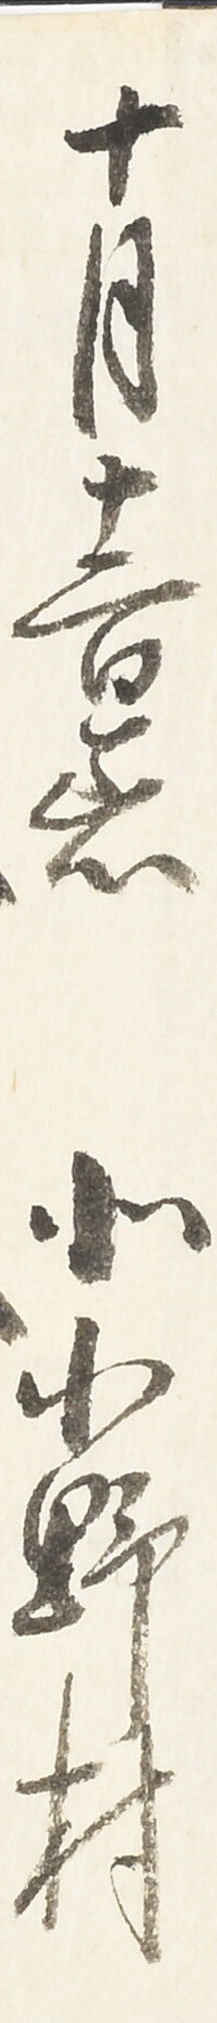十月十二日着北小野村
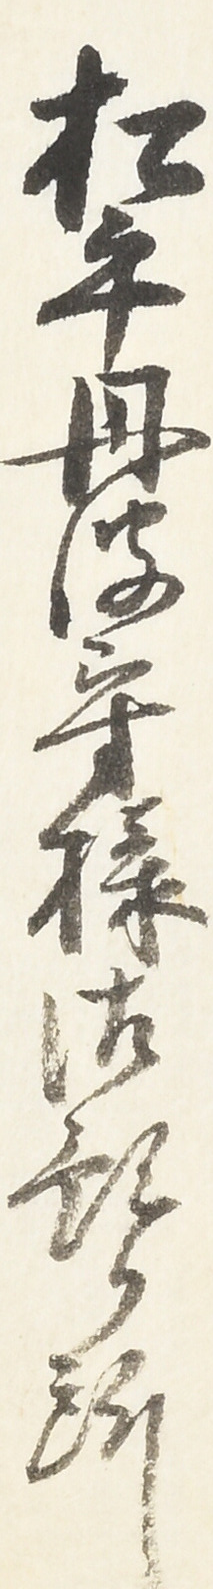松平丹波守様御預り所
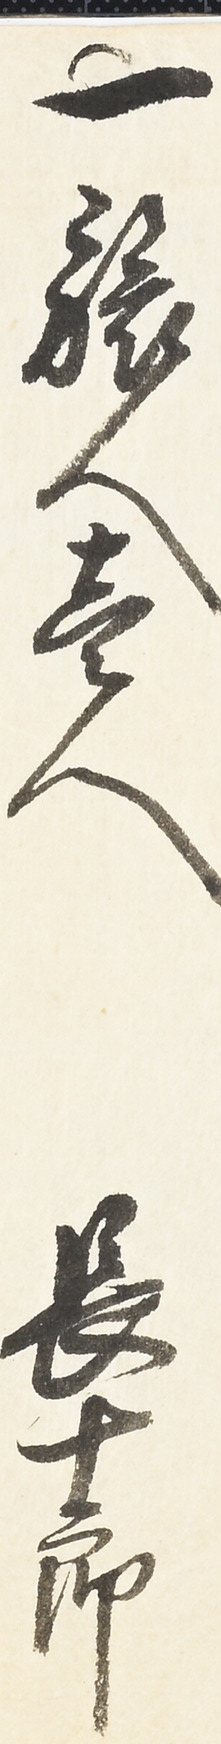一旅人壱人長十郎
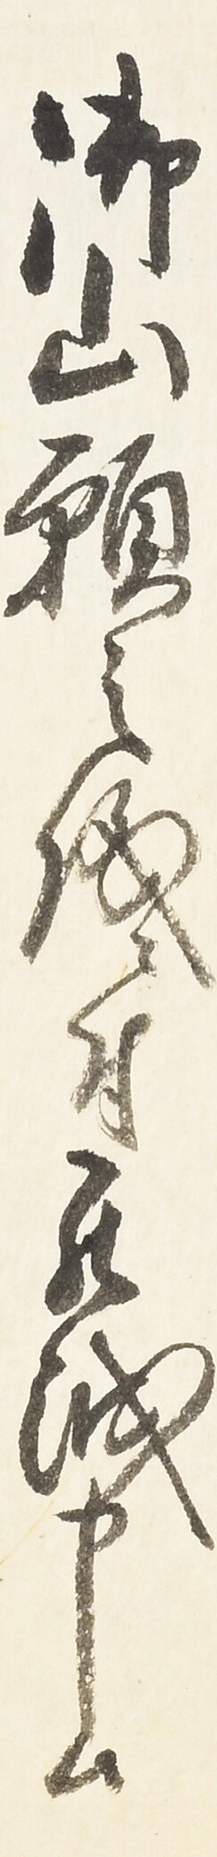御山預之儀ニ付罷越申候
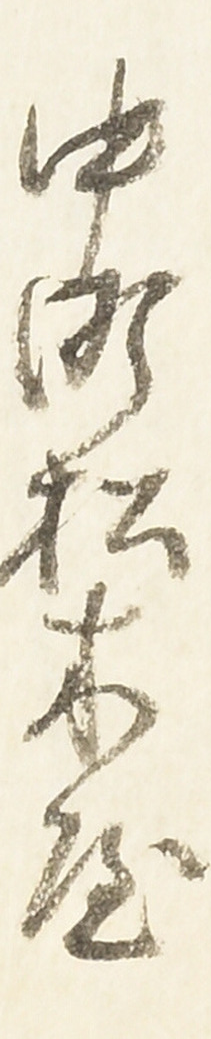中町松木屋
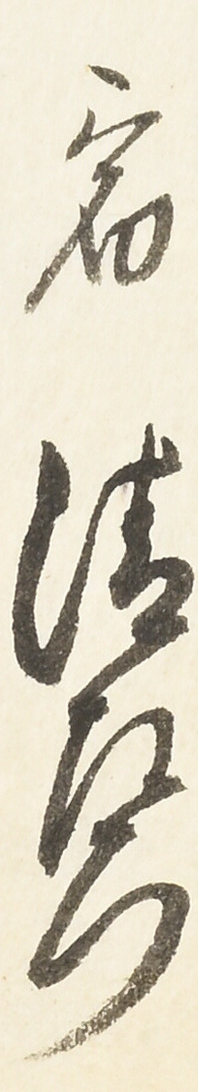宿清左衛門
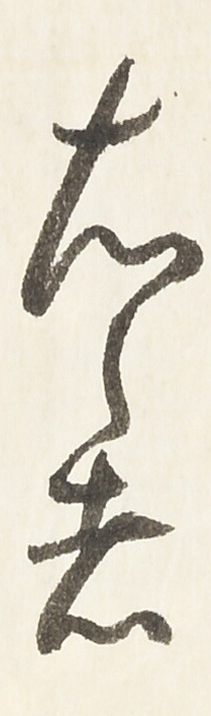右之者
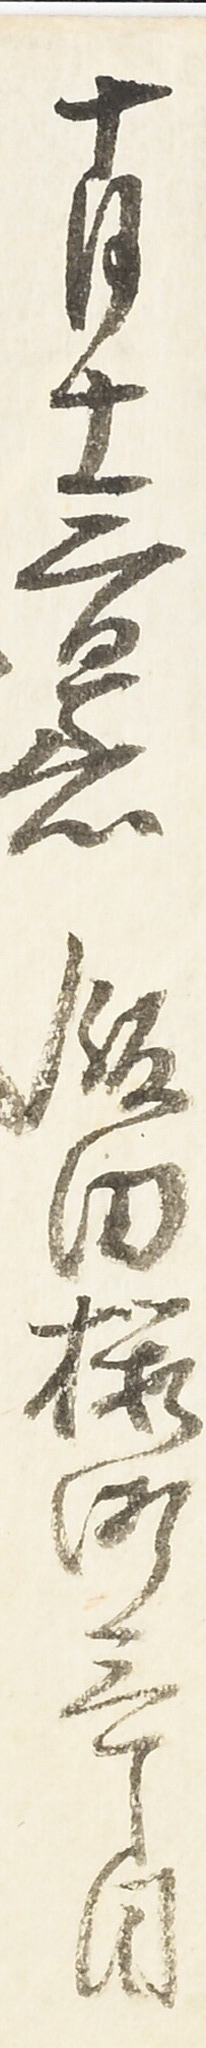十月十三日着飯田桜町三丁目
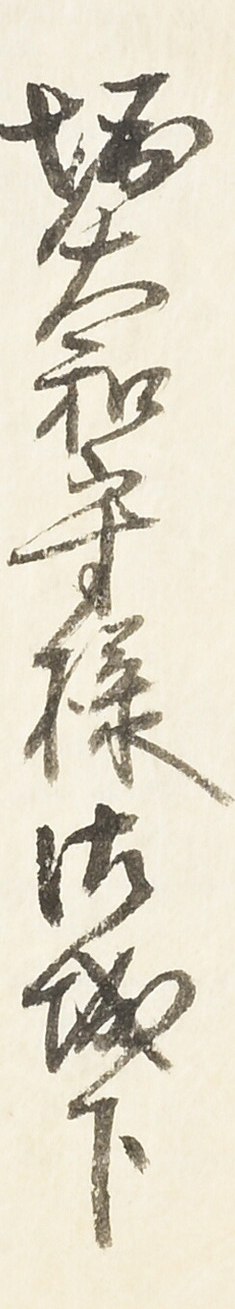堀大和守様御城下
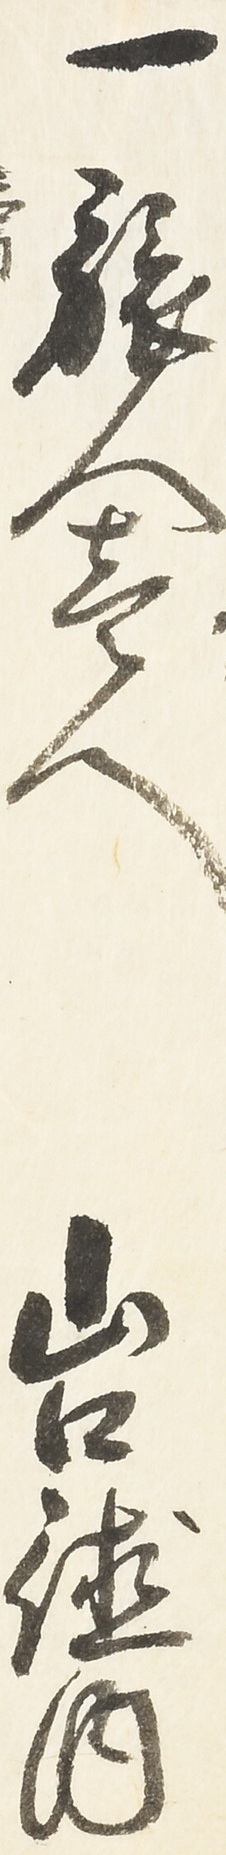一旅人壱人山口徳内
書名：町中旅人泊控帳
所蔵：伊那市立高遠町図書館・合同会社AMANE
